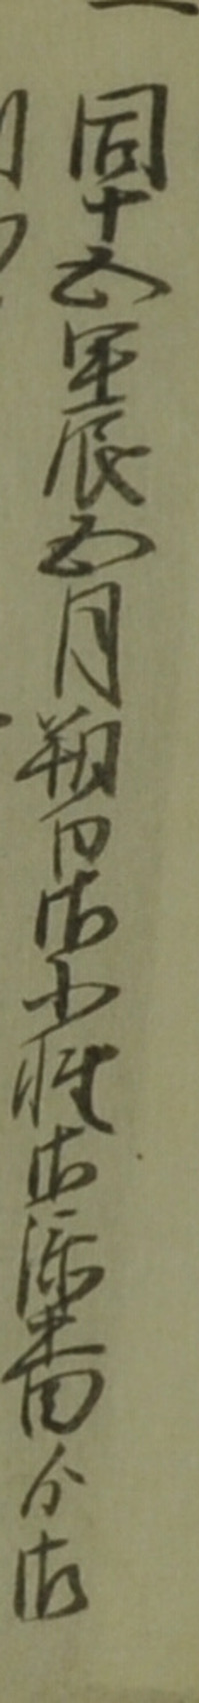一同十五甲辰五月朔日御小姓御添番ゟ御
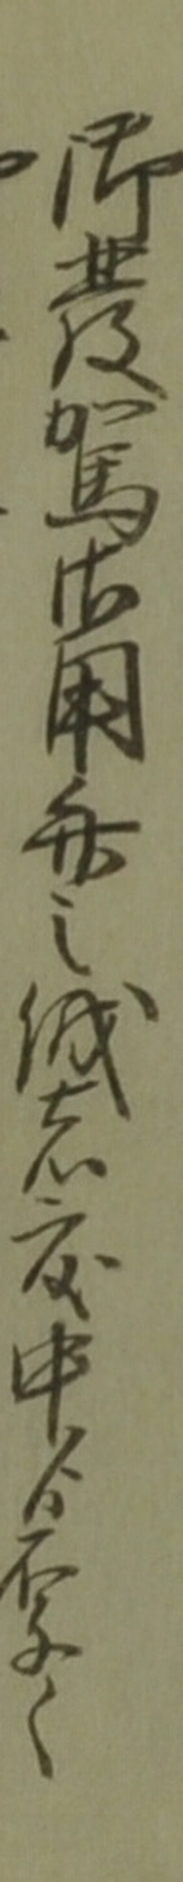御発駕御用弁之儀者度申ゟ厚く
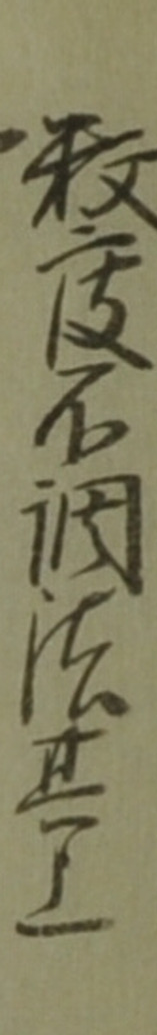数度不調法其上
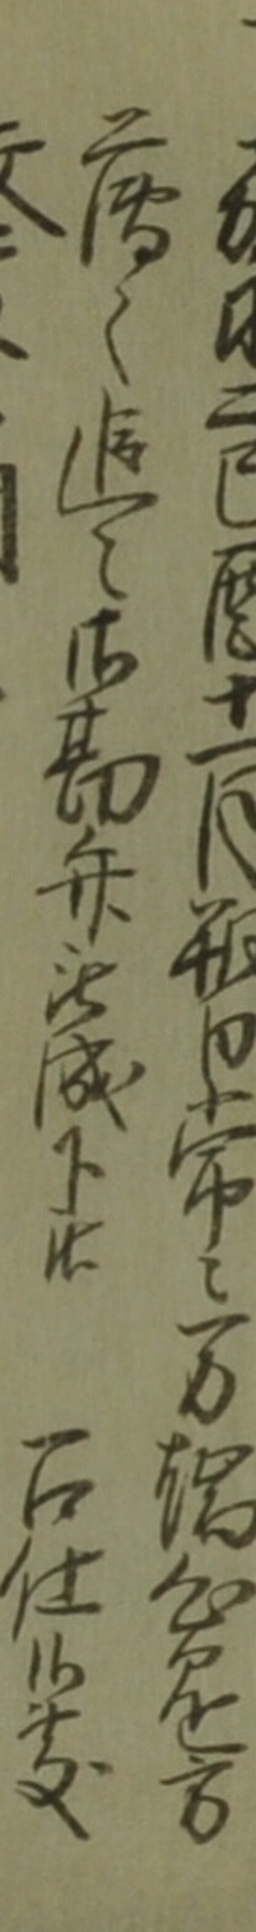薄々追々御勘弁被成下被召仕候処
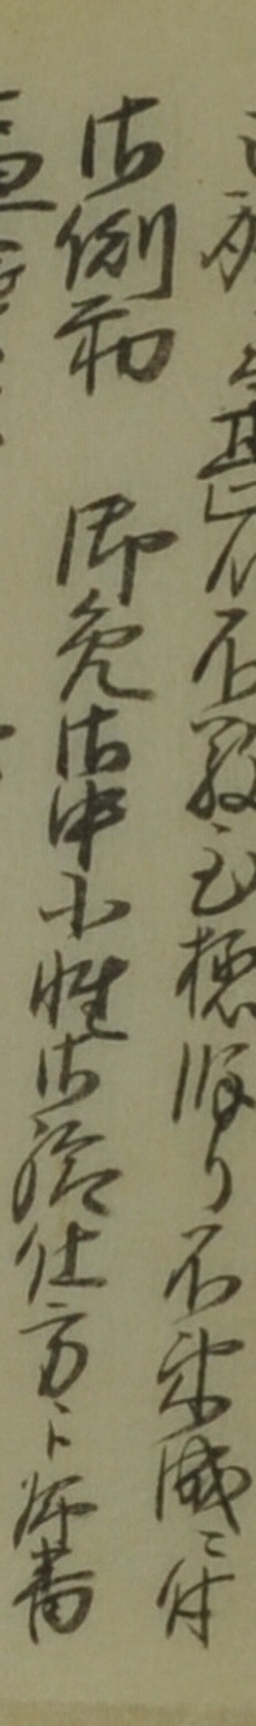御側勤御免御中小性御給仕方ト帰番
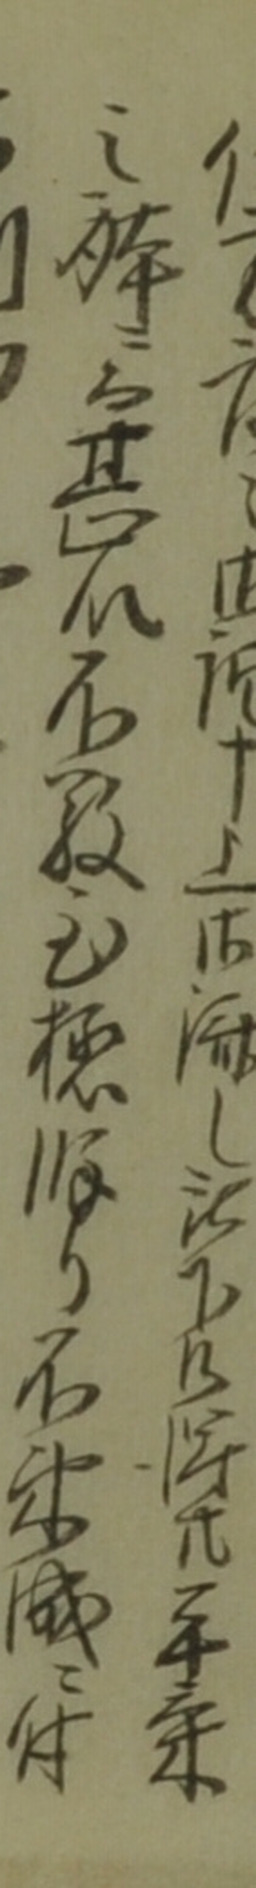之躰ニ而甚以不敬至極呼リ不束成ニ付
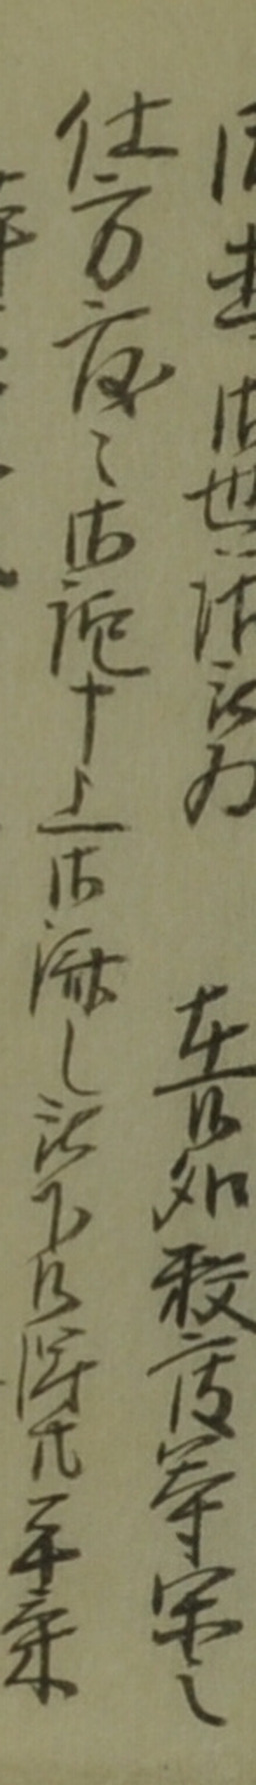仕方度々御詫申上御済し被下候得共平気
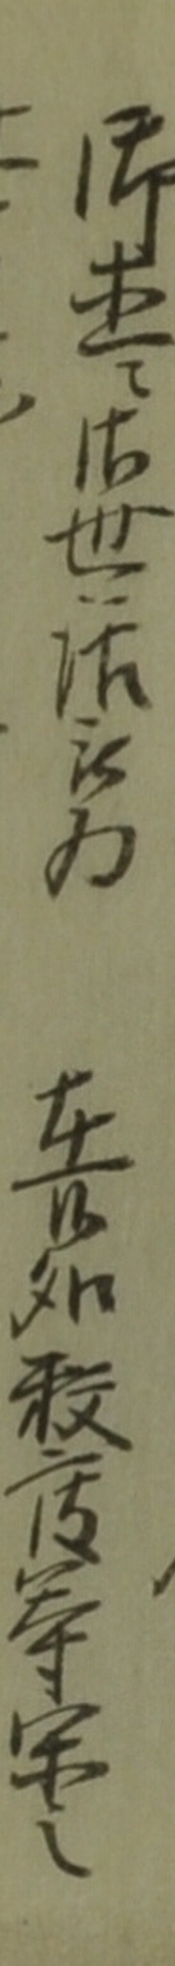御直ニ御世話被為在候処数度等閑之
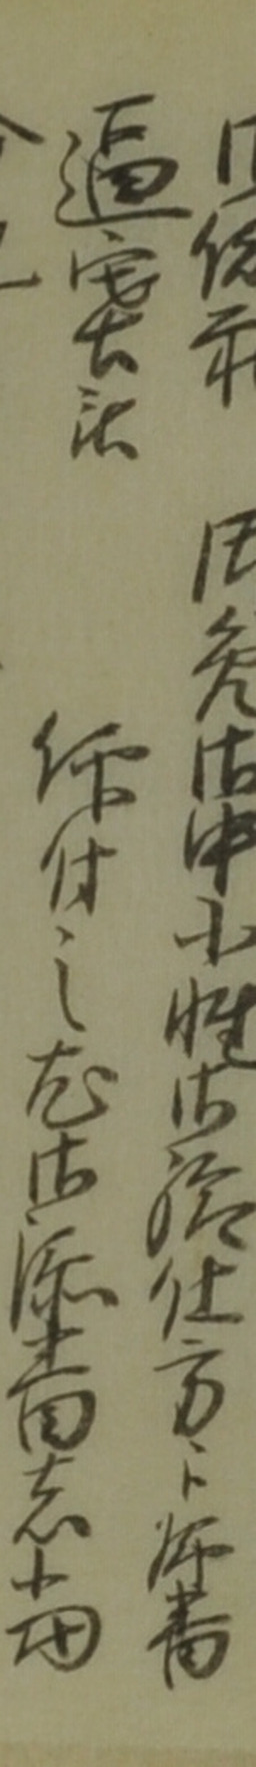逼塞被仰付之尤御添番者当
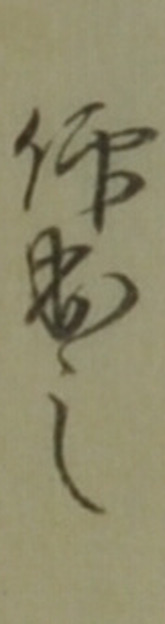仰付之
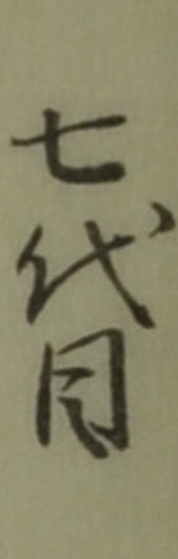七代目
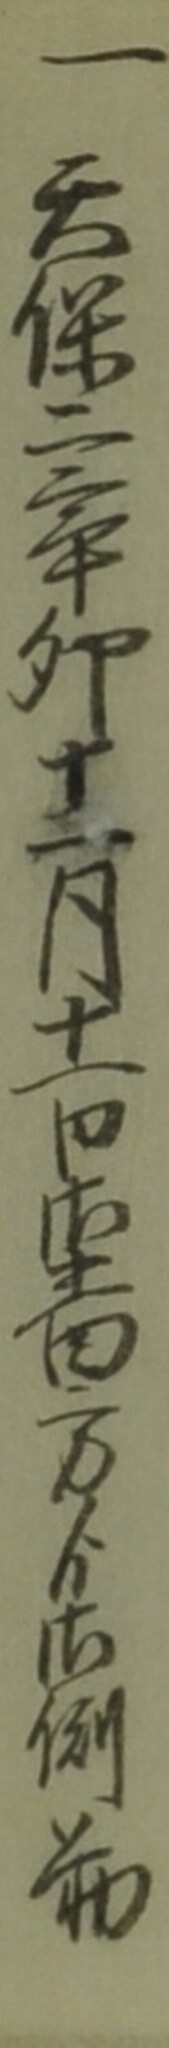一天保二辛卯十二月十一日御番方ゟ御側勤
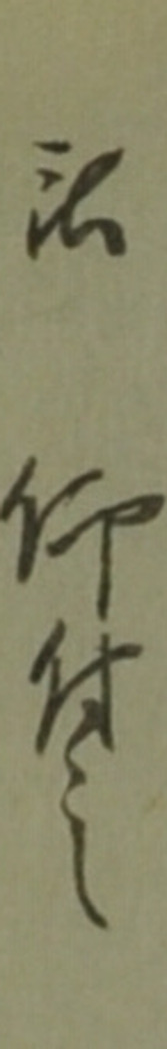被仰付之
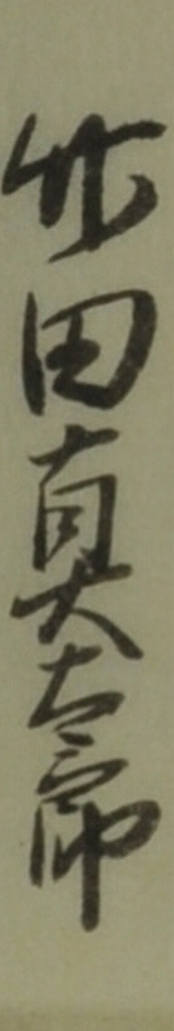竹田真太郎
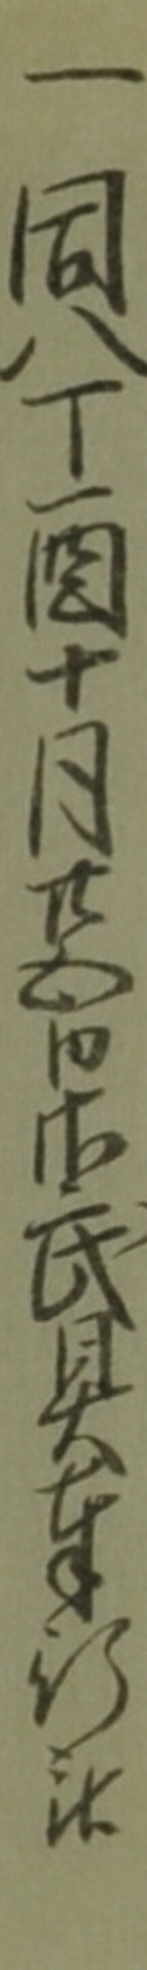一同八丁酉十月廿五日御武具奉行被
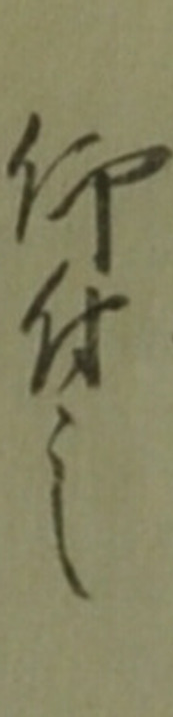仰付之
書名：諸御役代々録（五）
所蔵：伊那市立高遠町図書館・合同会社AMANE
